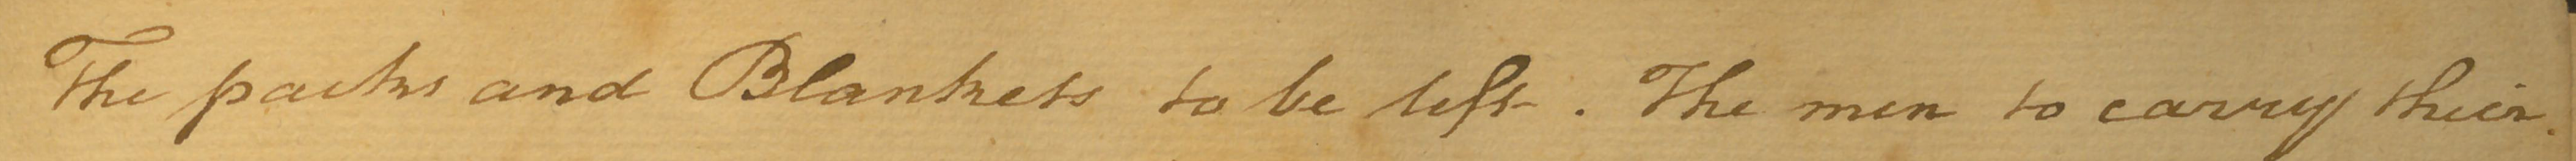The packs and Blankets to be left. The men to carry their
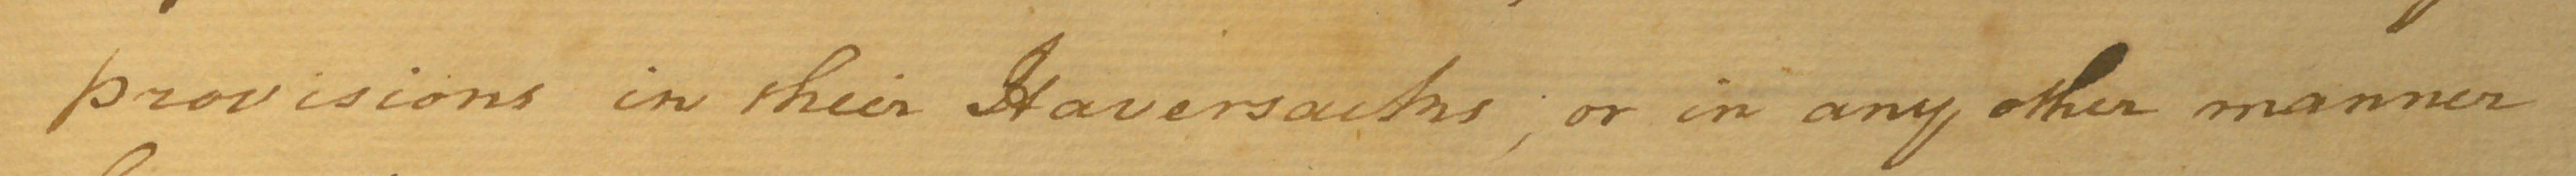provisions in their Haversacks, or in any other manner
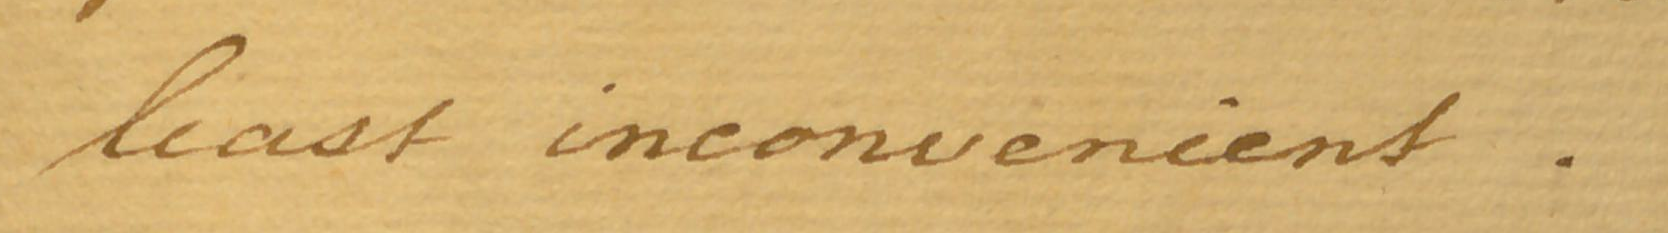least inconvenient.
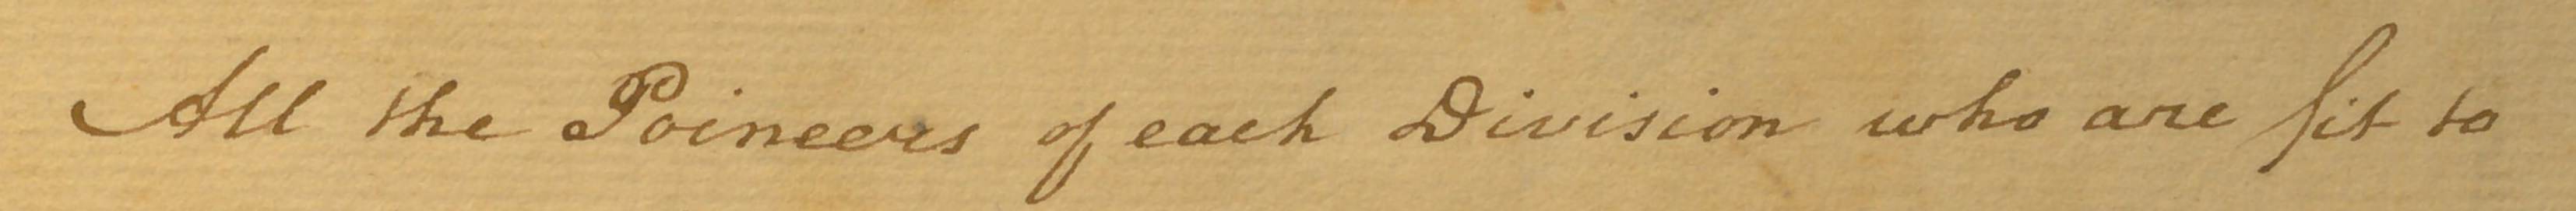All the Poineers of each Division who are fit to
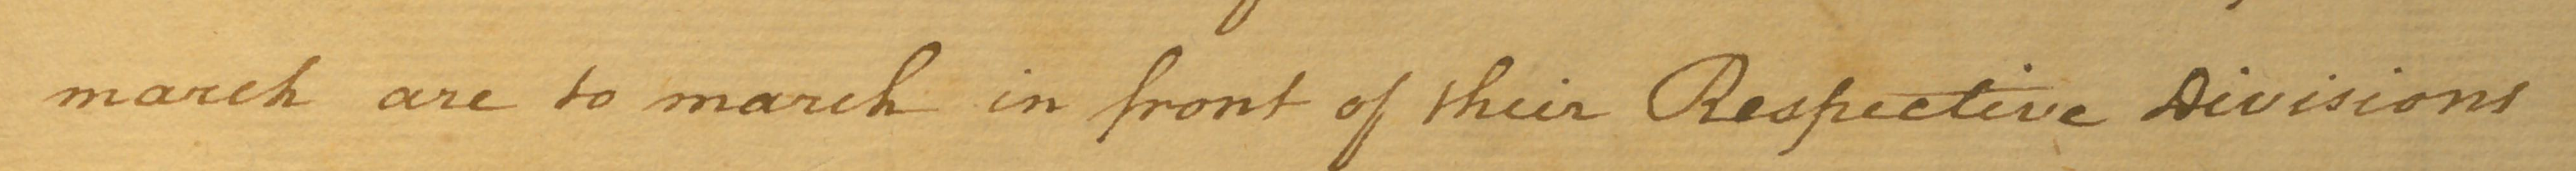march are to march in front of their Respective Divisions
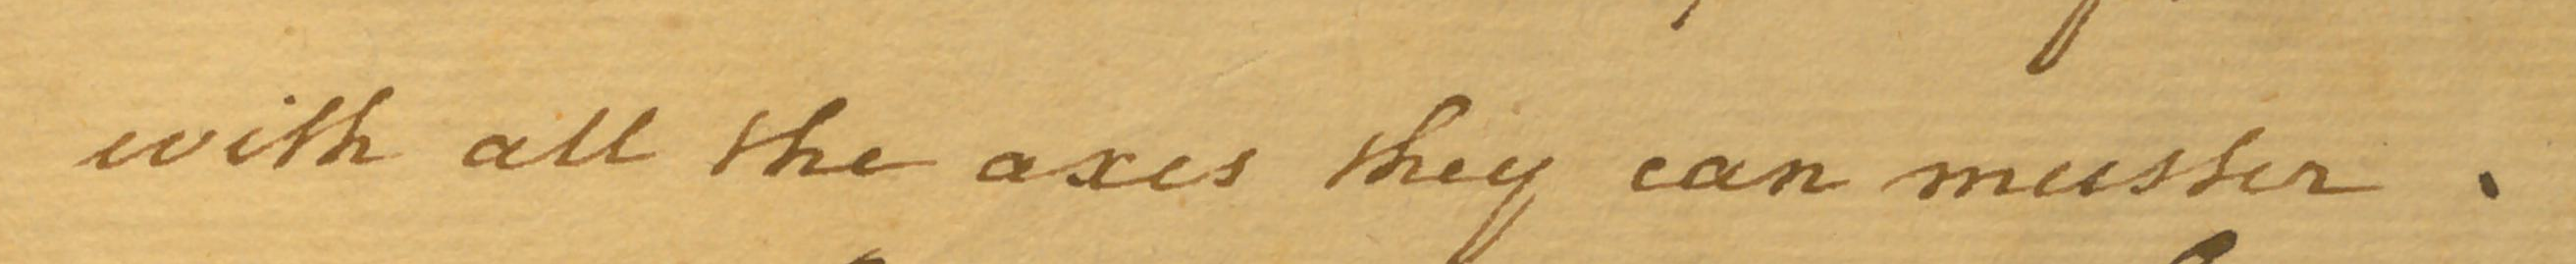with all the axes they can muster.
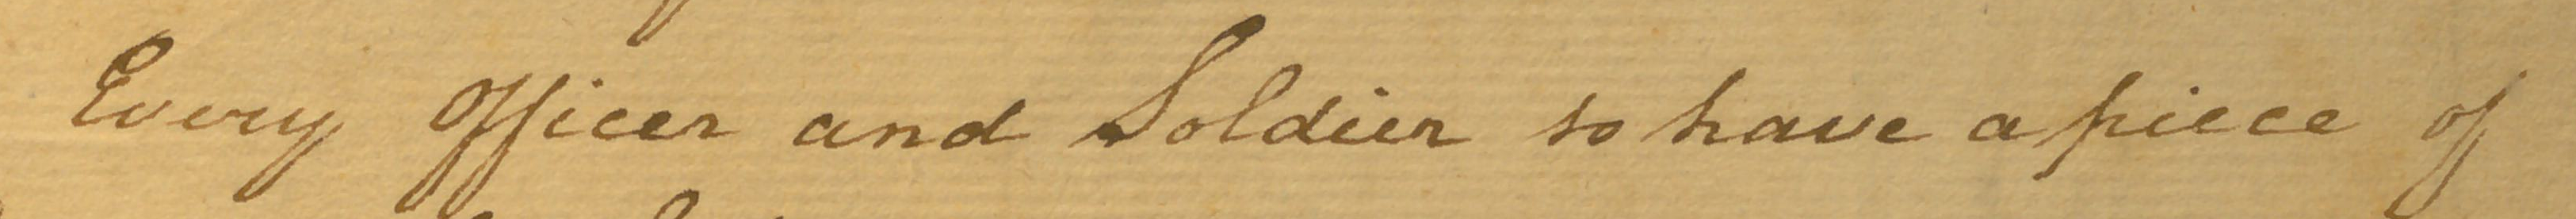Every Officer and Soldier to have a piece of
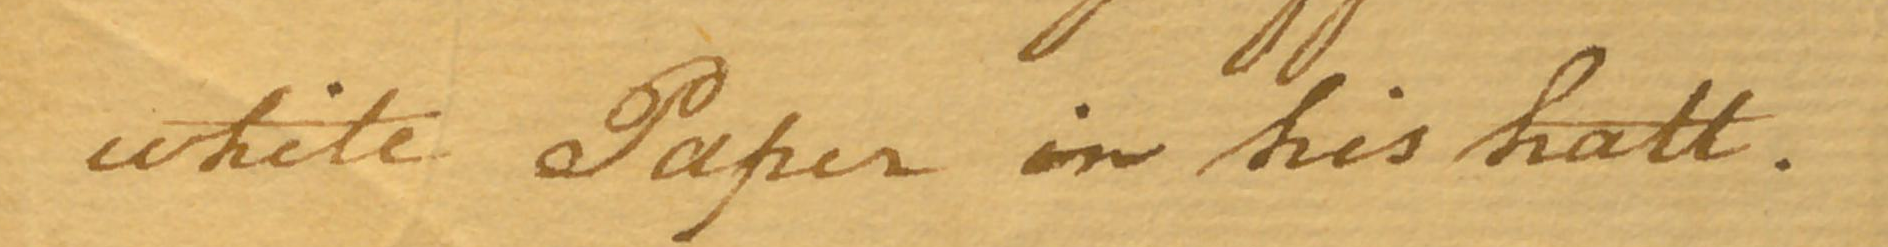white Paper in his hatt.
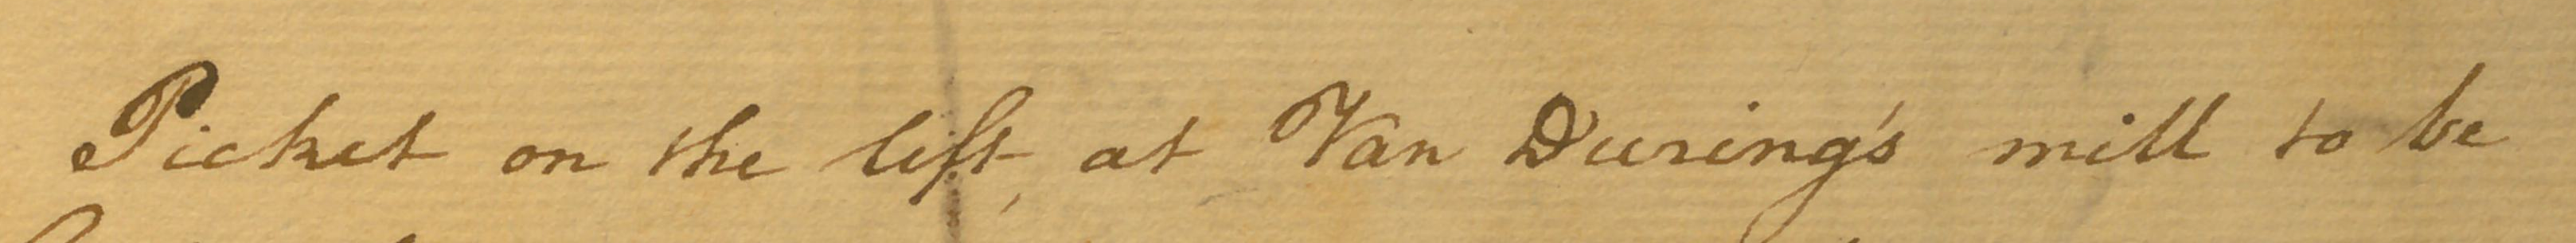Picket on the left at Van During's mill to be
